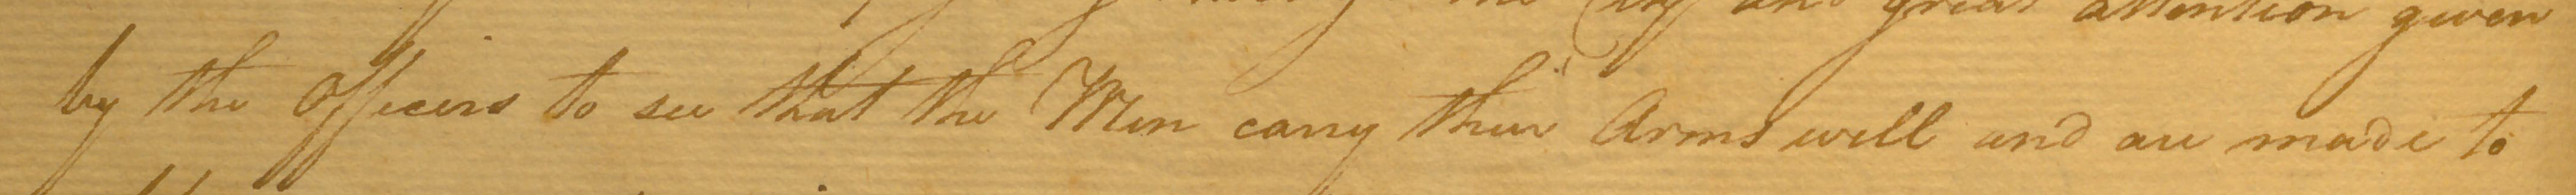by the Officers to see that the Men carry their Arms well and are made to
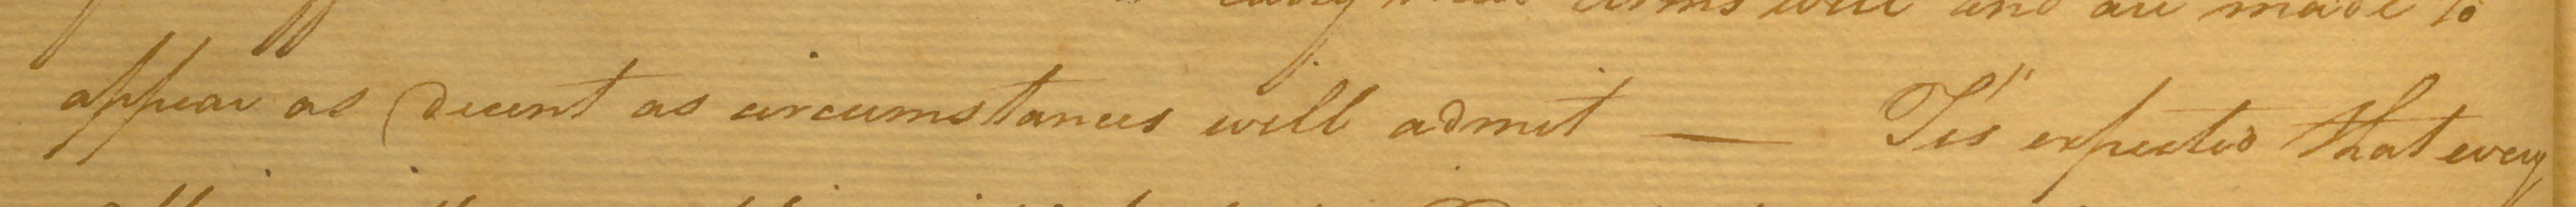appear as decent as circumstances will admit- T'is expected that every
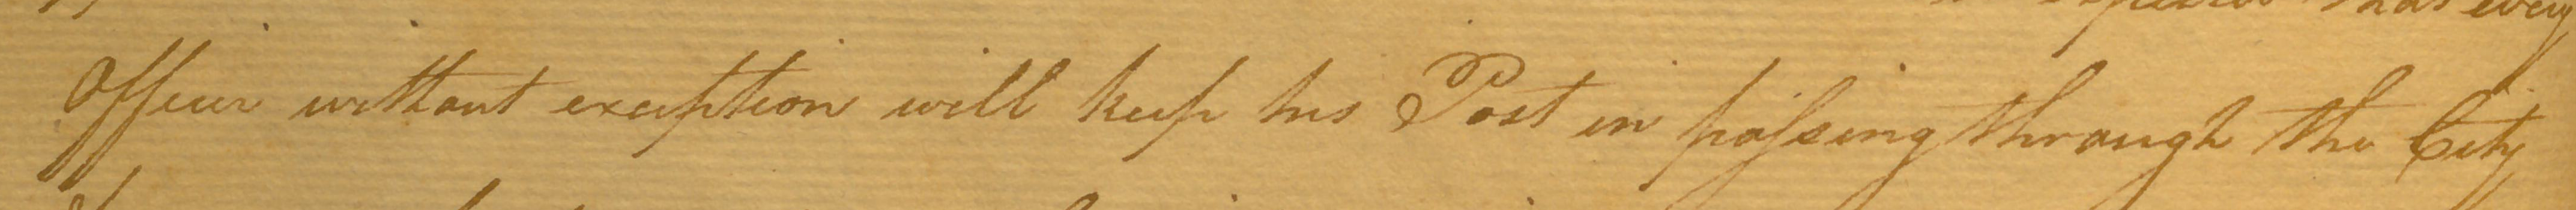Officer without exception will keep his Post in passing through the City
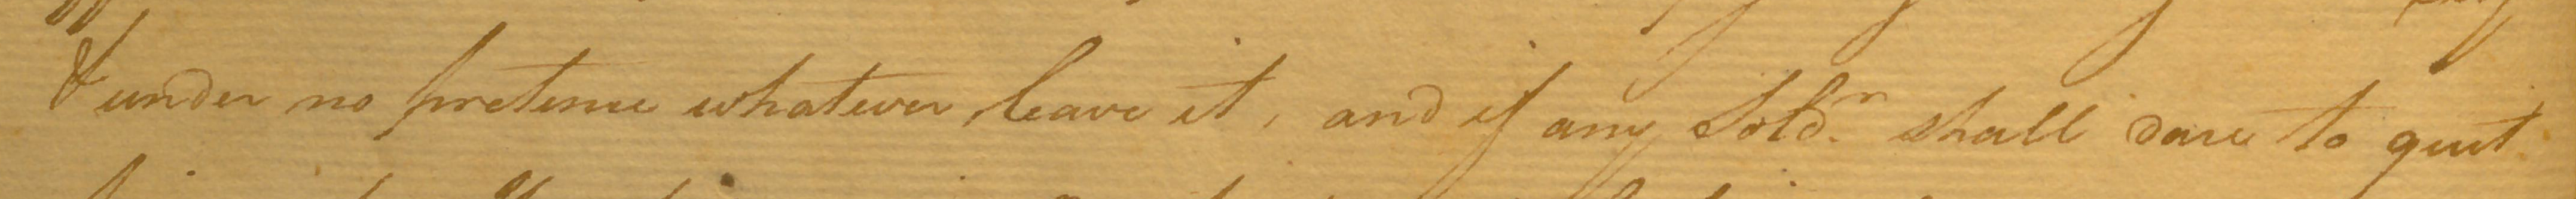& under no pretense whatever leave it, and if any Sold^r. shall dare to quit
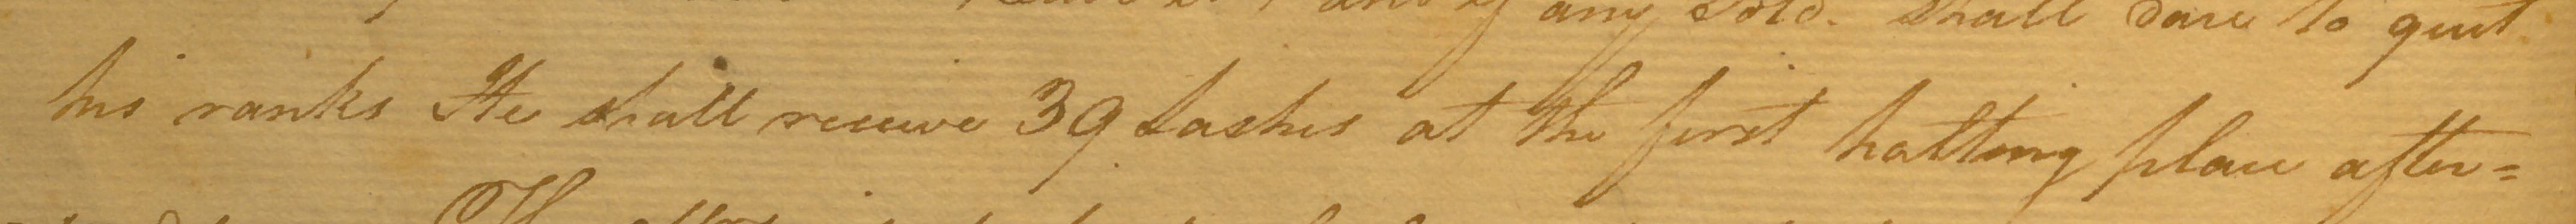his ranks He shall receive 39 Lashes at the first halting place after-
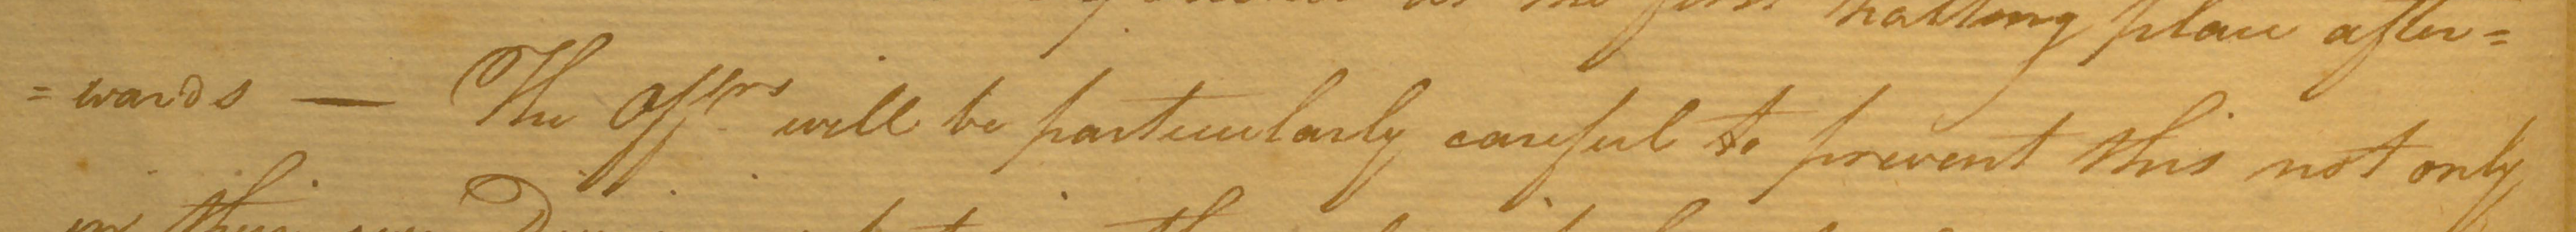-wards- The Off^rs will be particularly careful to prevent this not only
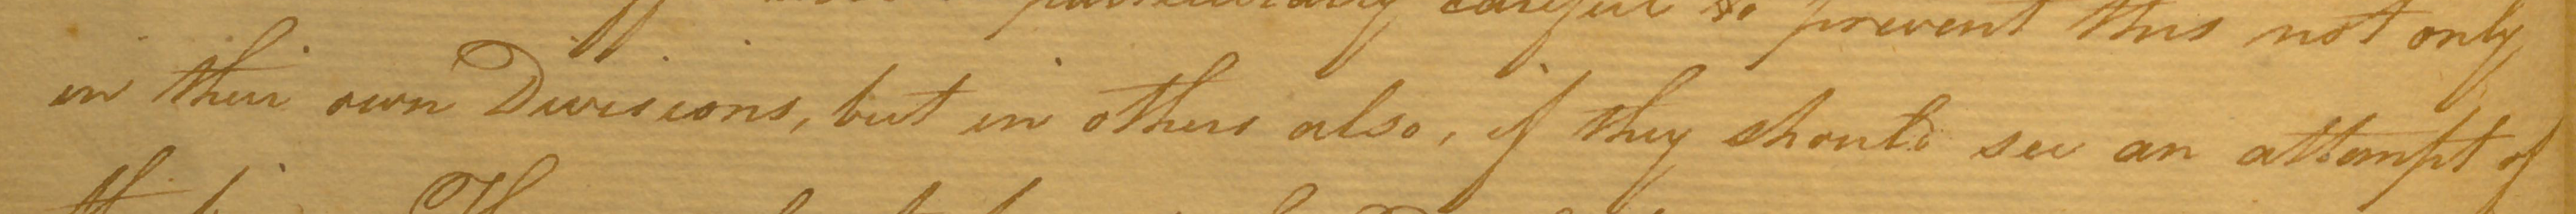in their own Divisions, but in others also, if they should see an attempt of
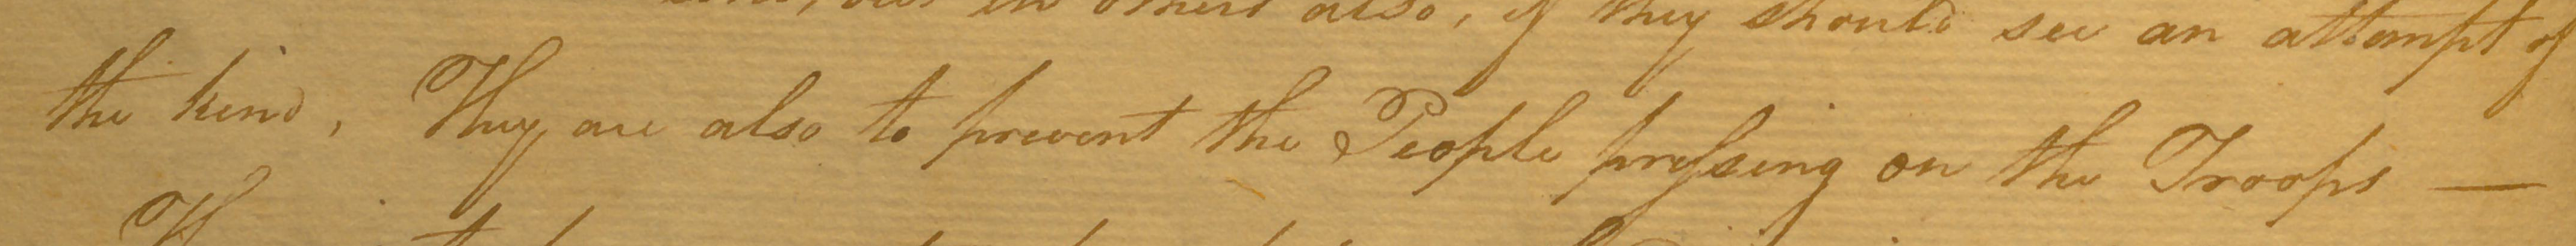the kind, They are also to prevent the People pressing on the Troops-
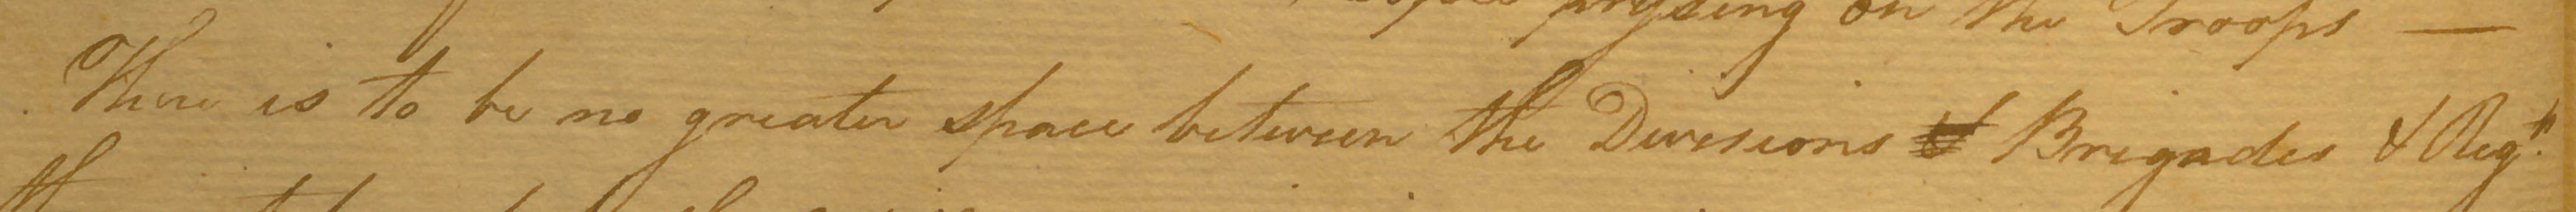There is to be no greater space between the Divisions [_] Brigades & Reg^t.
